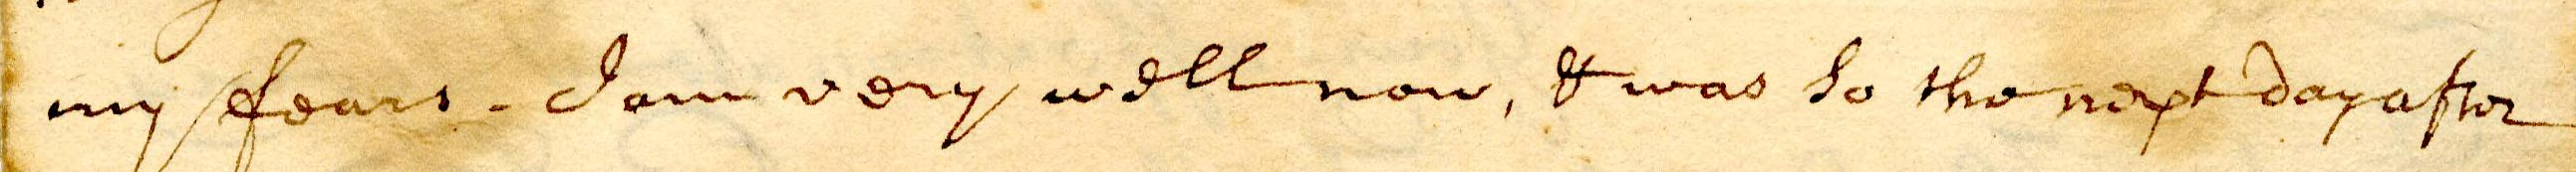my fears. I am very well now, & was so the next day after
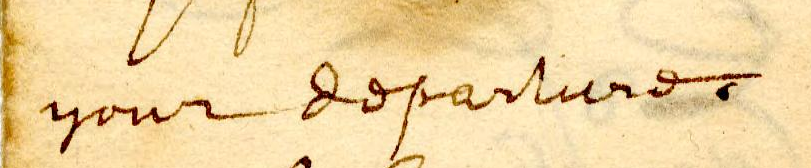your departure.
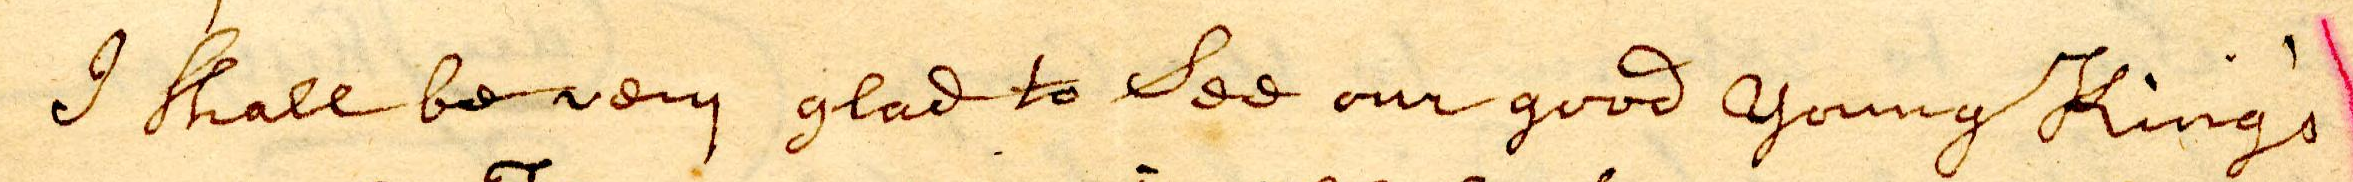I shall be very glad to see our good Young King's
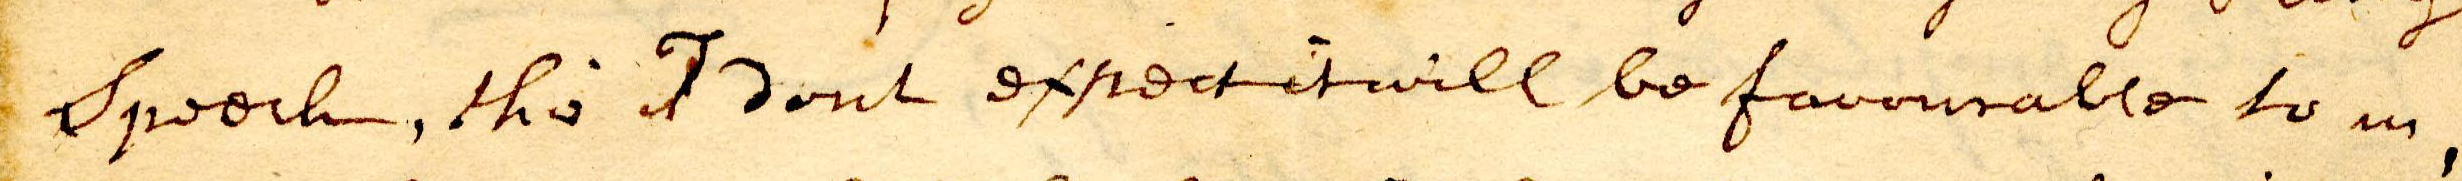Speech, tho' I dont expect it will be favourable to us,
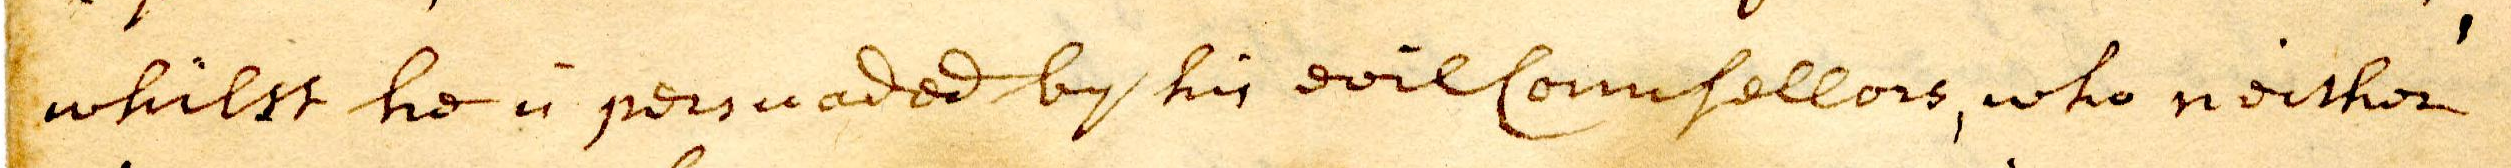whilst he is persuaded by his evil Counsellors, who neither
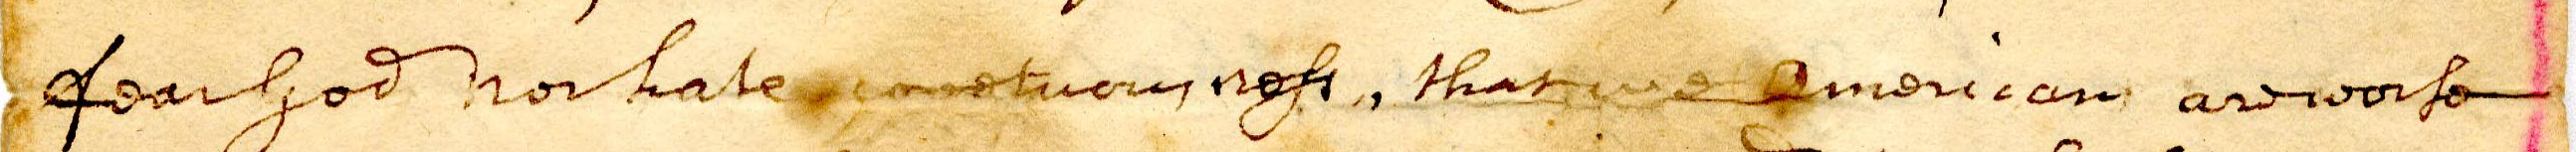fear God nor hate [____]otuousness that us Americans are worse
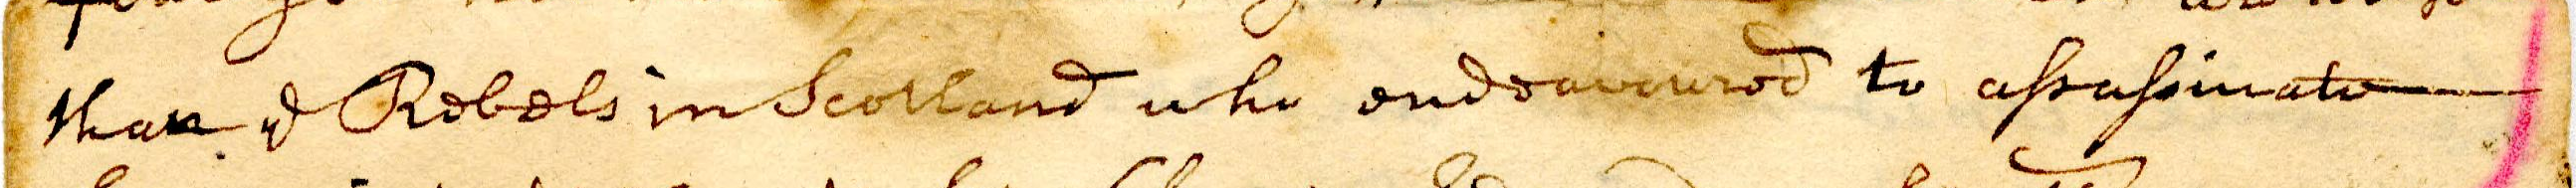than y^e Rebels in Scotland who endeavored to assassinate
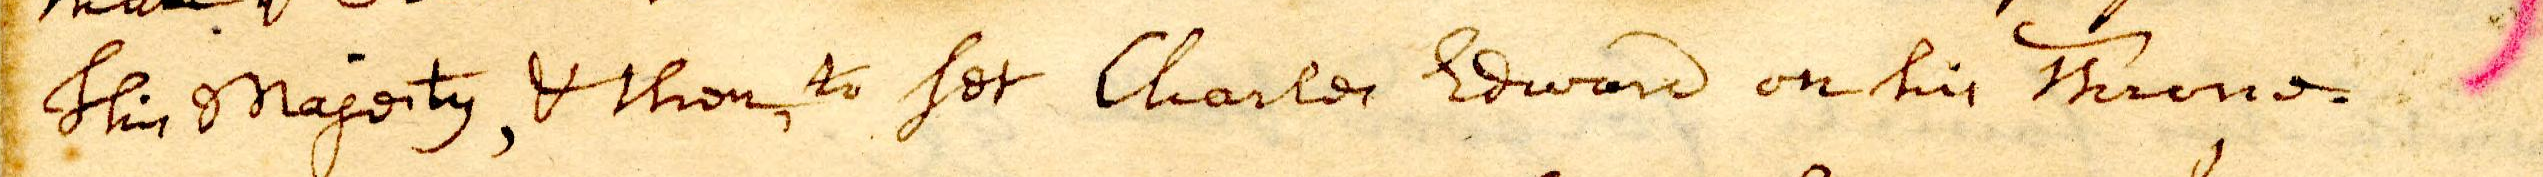His Majesty, & then, to set for Charles Edward on his throne.
